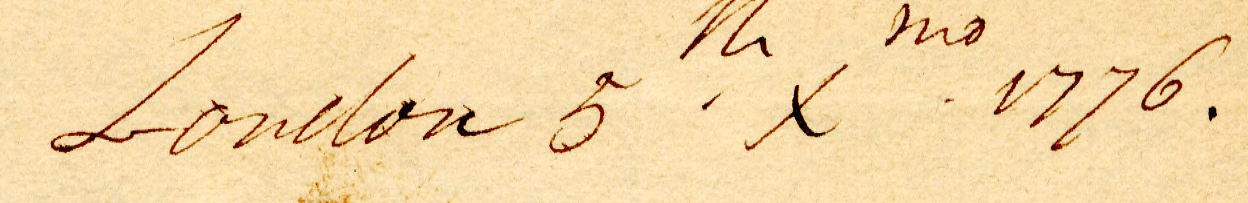London 5^th. X^mo. 1776
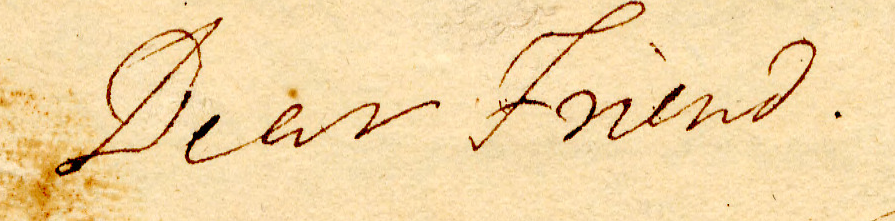Dear Friend.
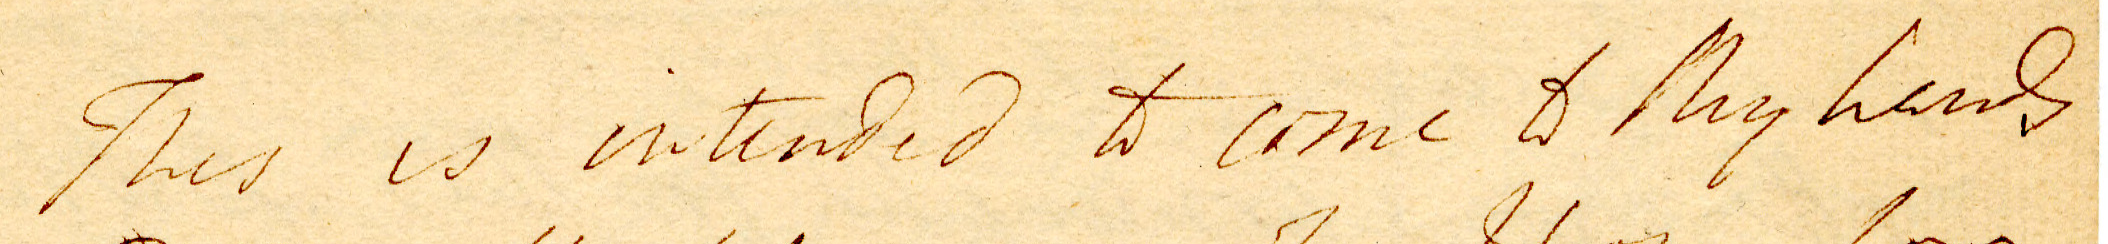This is intended to come to thy hands
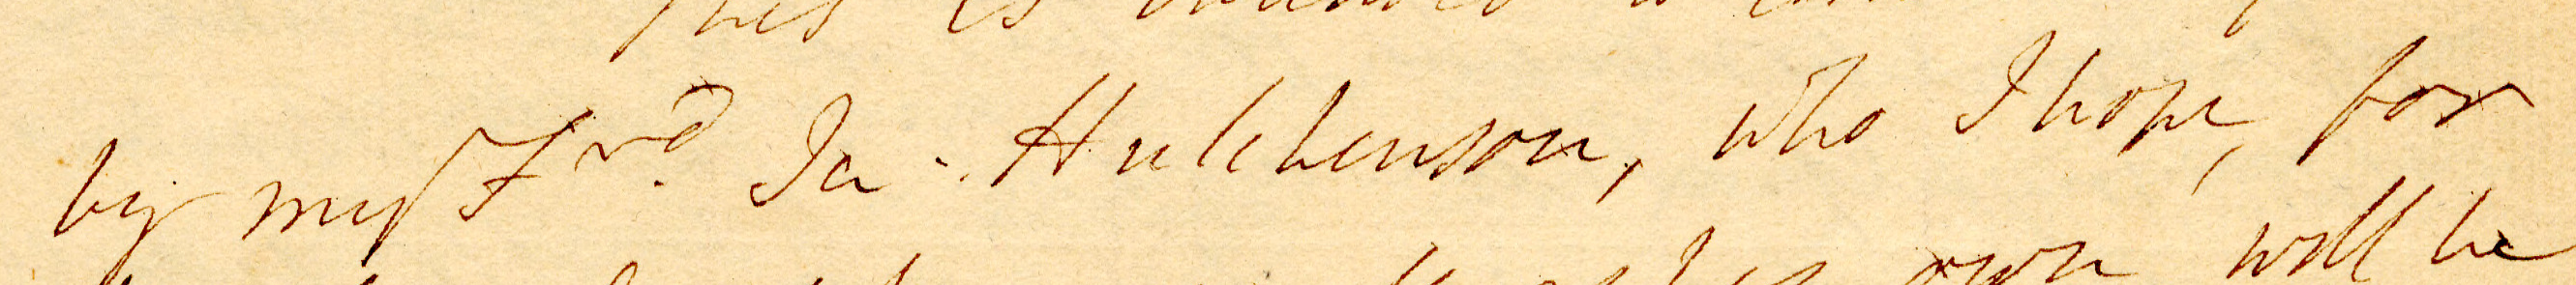by my F^rd. Ja. Hutchinson, who I hope, for
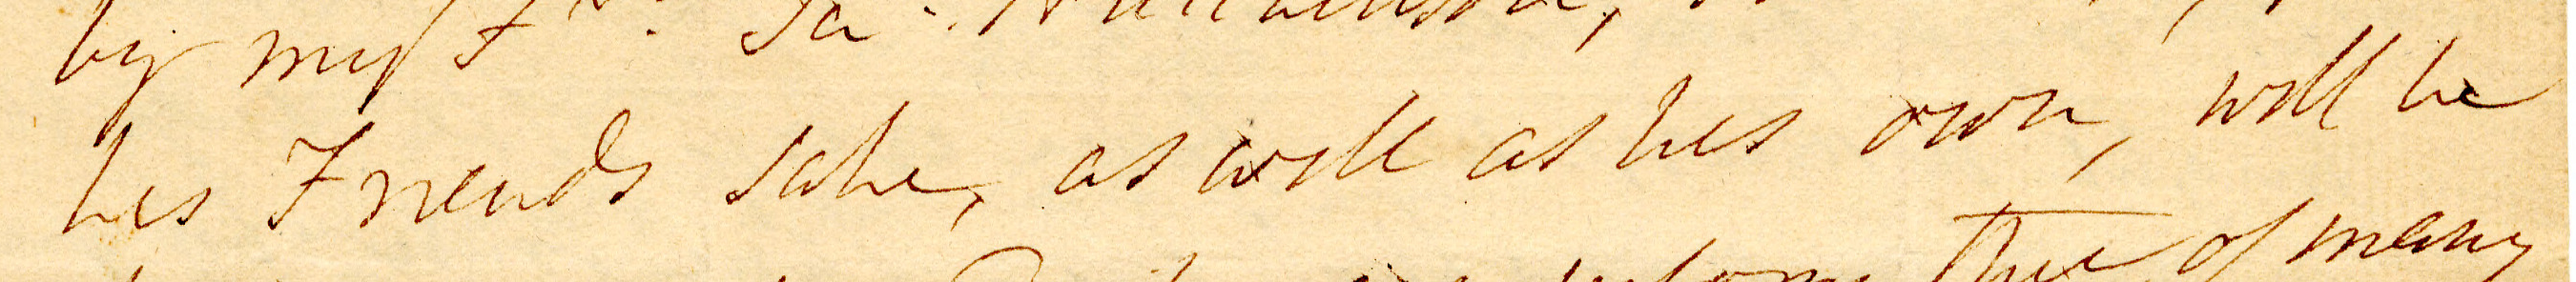his Friends sake, as well as his own, will be
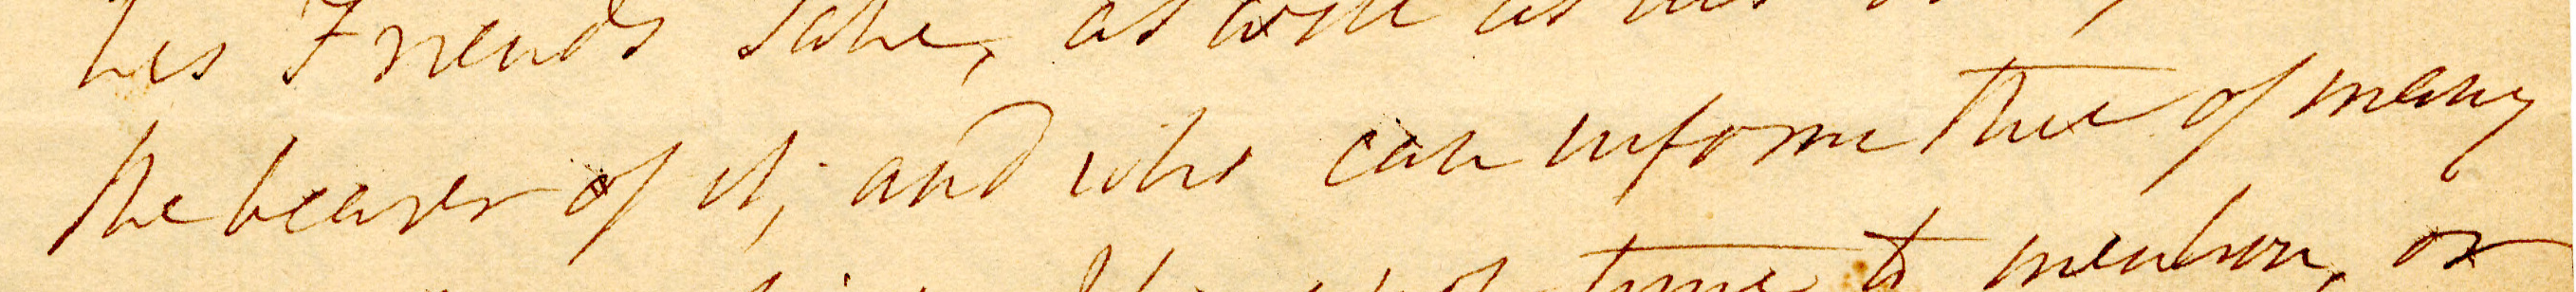the bearer of it, and who can inform thee of many
